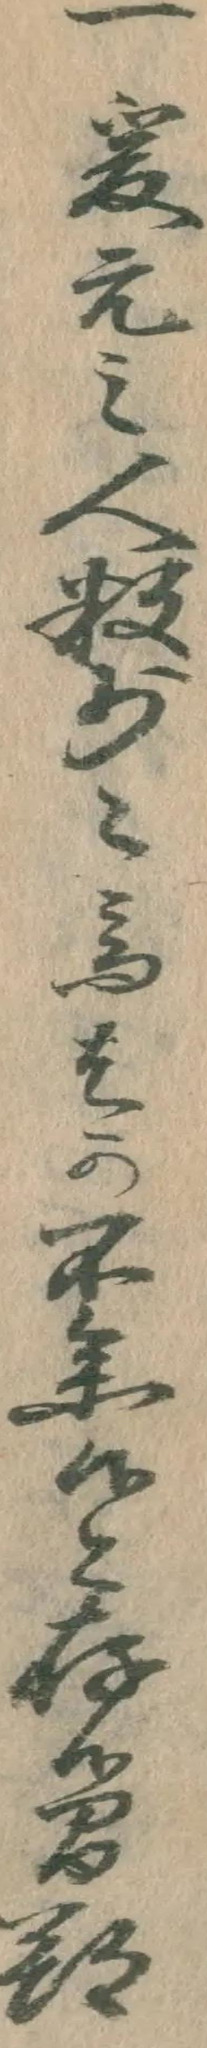一爰元之人数少々に而者可不参候と存候間朔
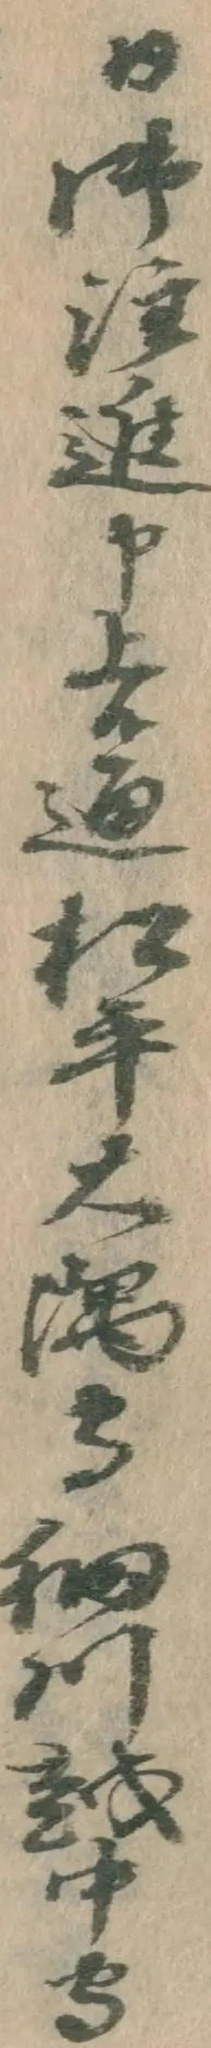日御注進申上候通松平大隅守細川越中守
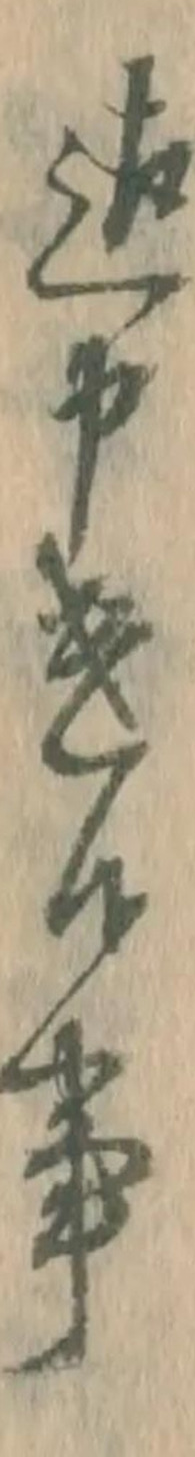迄申遣候事
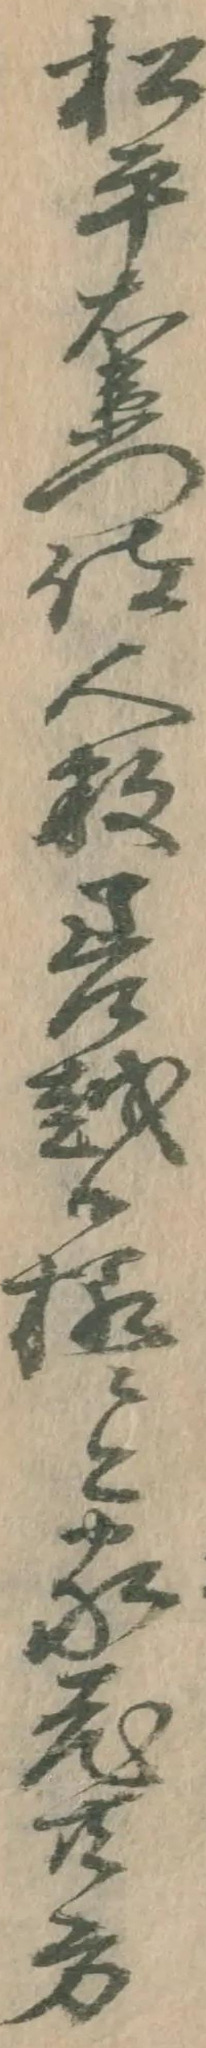松平右衛門佐人数差越候様にと家老共方

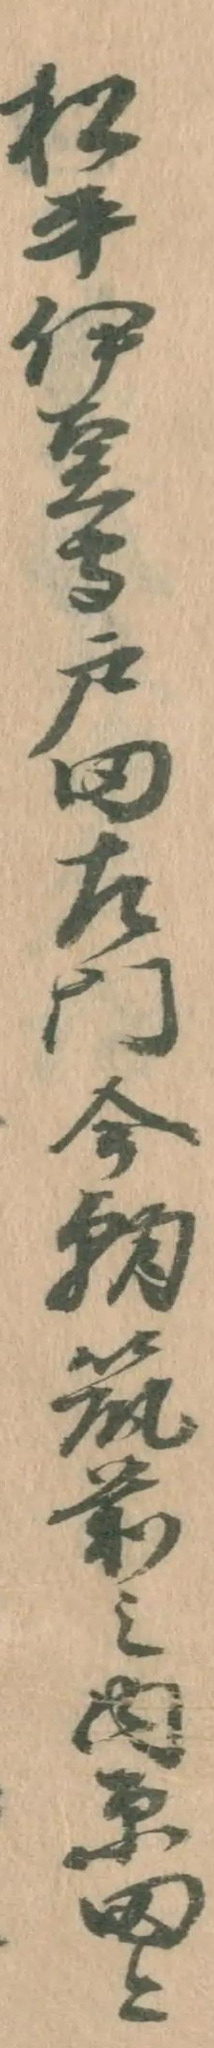一松平伊豆守戸田左門今朝筑前之内原田と
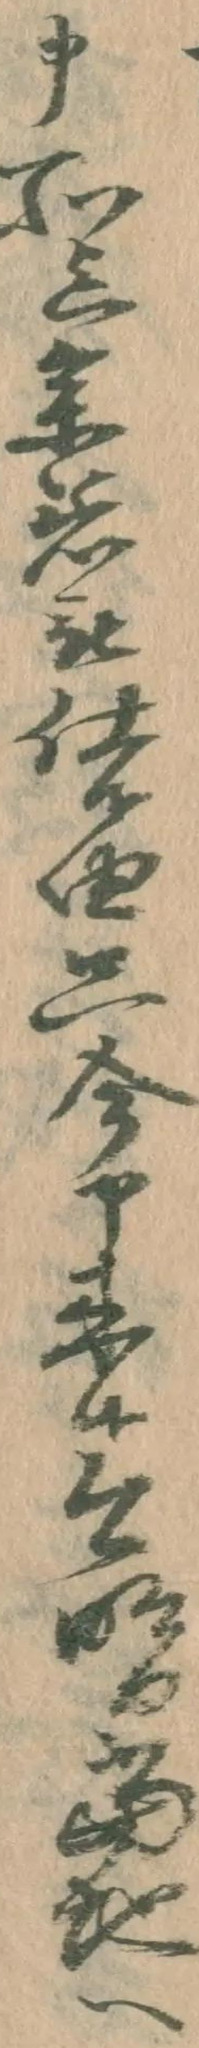申所迄参着被仕候由只今申来候今明ゟ当地へ
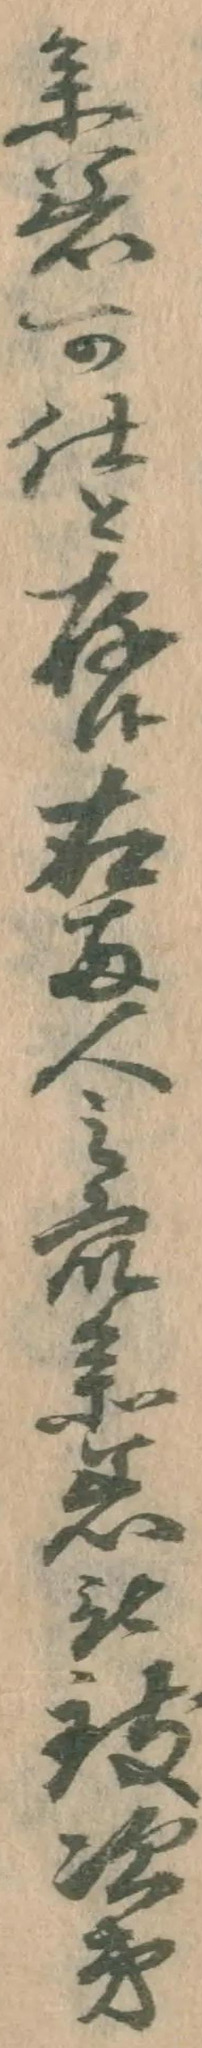参着可仕と存候右両人之衆参着被致次第
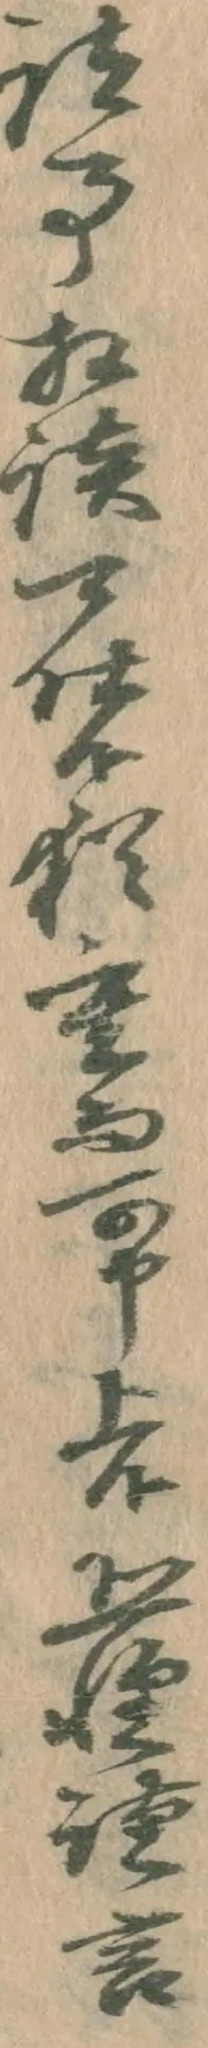諸事相談可仕候猶重而可申上候恐惶謹言
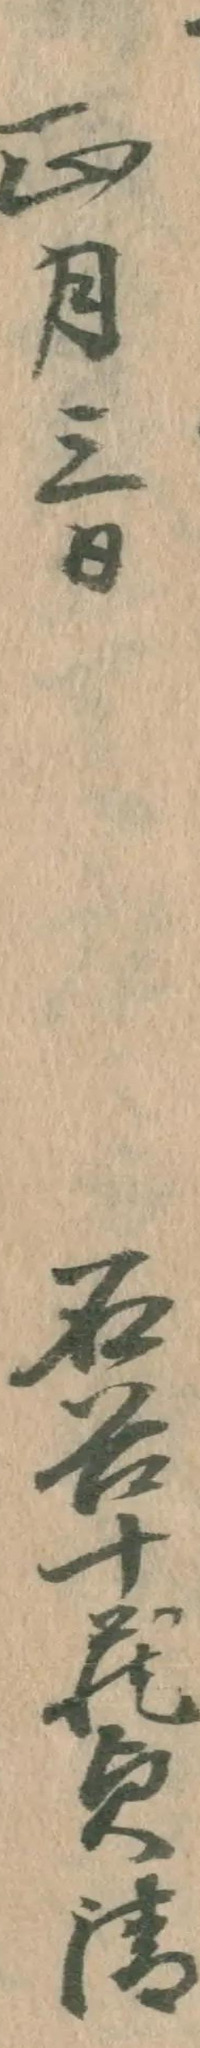正月参日石谷十蔵貞清
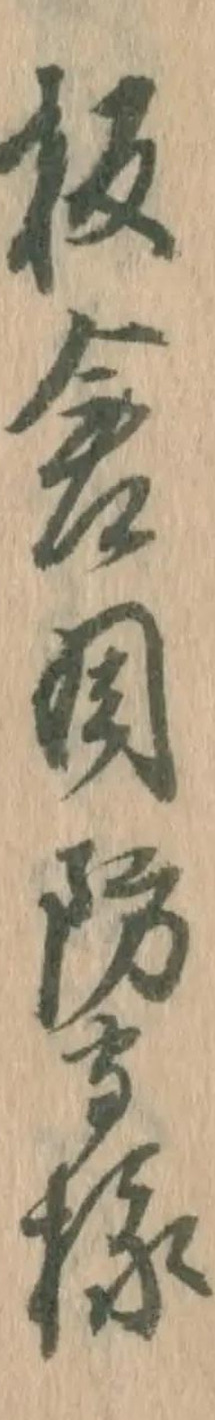板倉周防守様
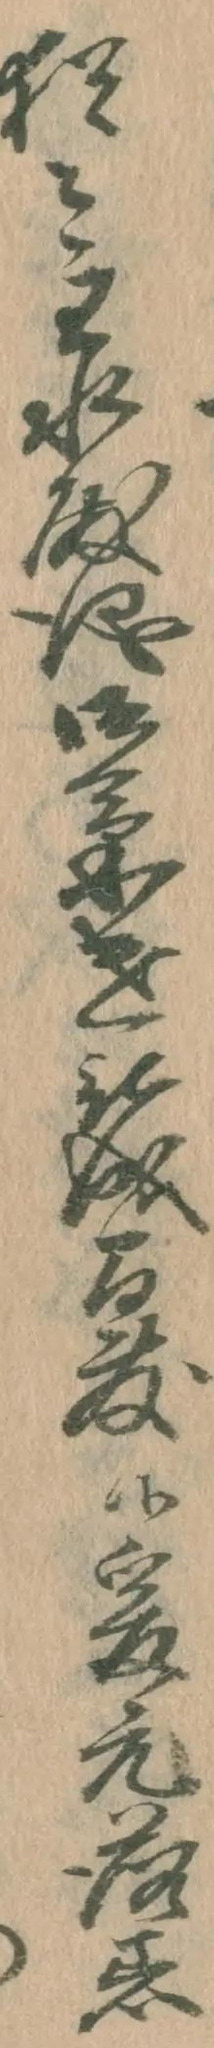猶々主水殿儀御気遣被成間敷候爰元落着
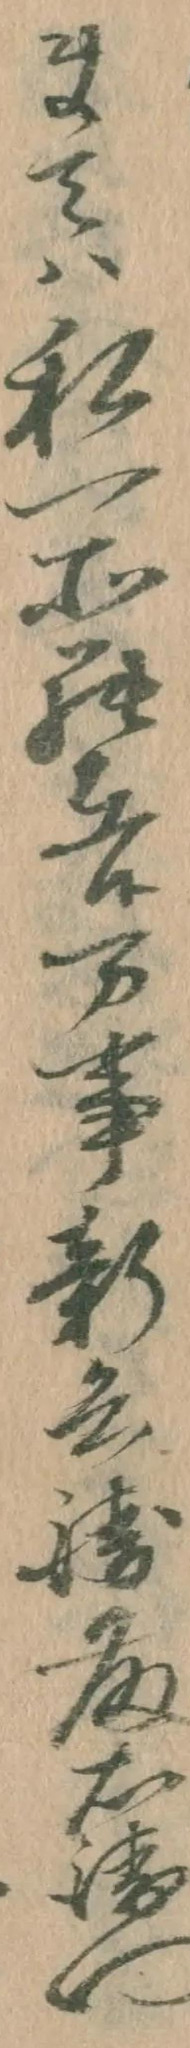まては私一所罷在候万事新兵衛藤右衛門
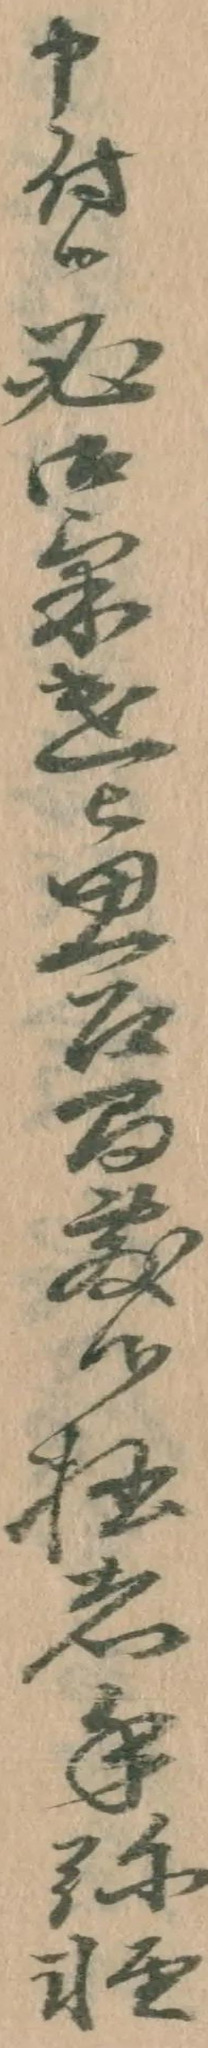申付候必御気遣被思召間敷候拙者手弥軽
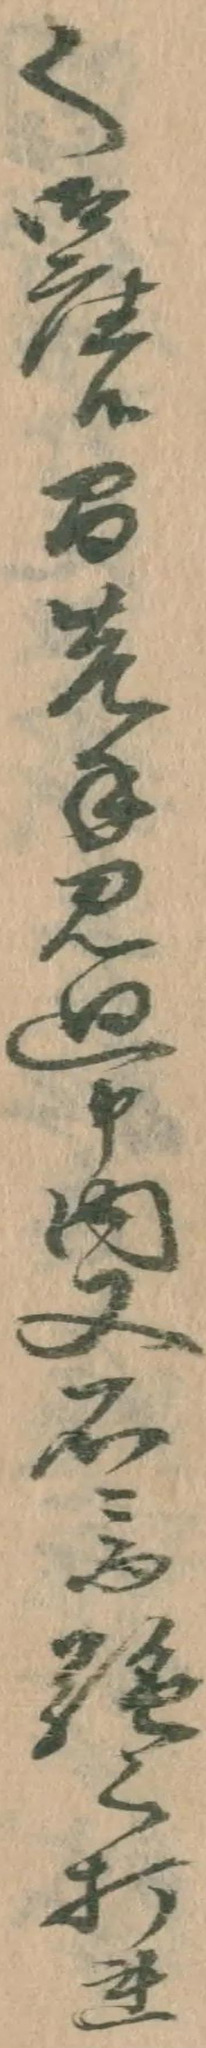く御座候間先手見廻申内又石に而強く打連
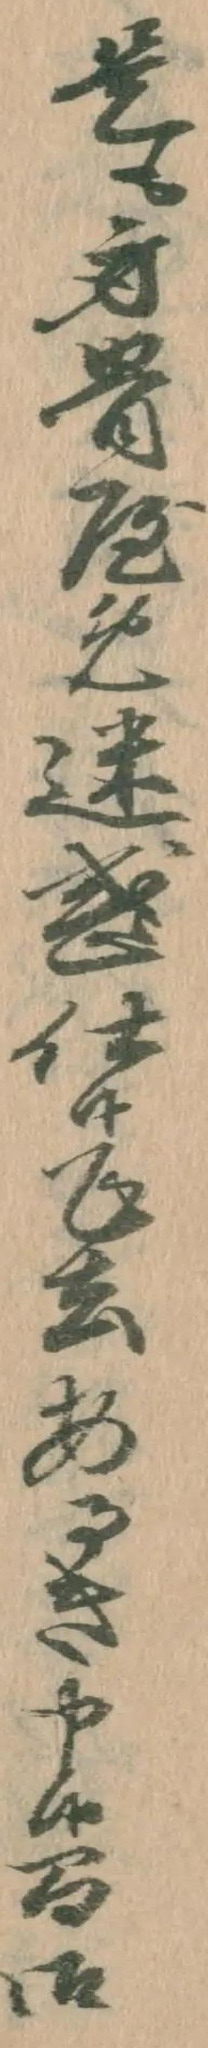是も身骨屋免迷惑仕候乍去あるき申候間御
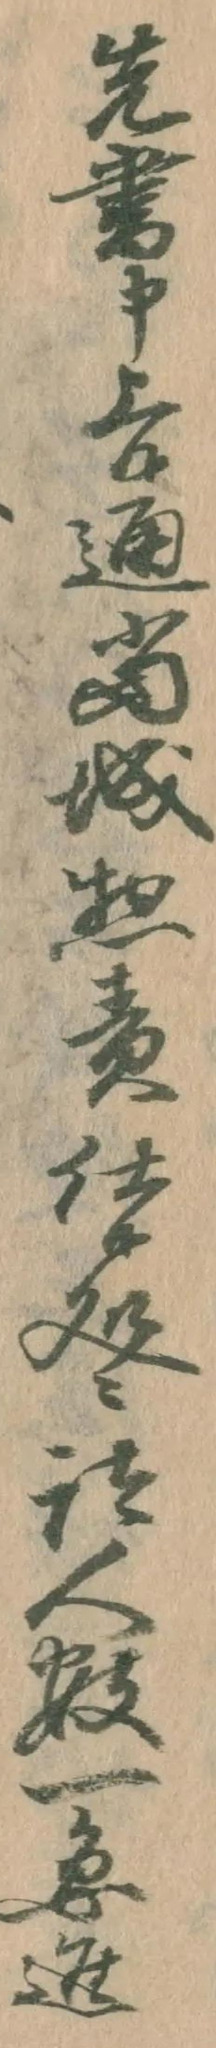先書申上候通当城惣責仕候処に諸人数一円進
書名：切支丹御退治記 49巻. [5]
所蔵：国立国会図書館 National Diet Library, JAPAN
